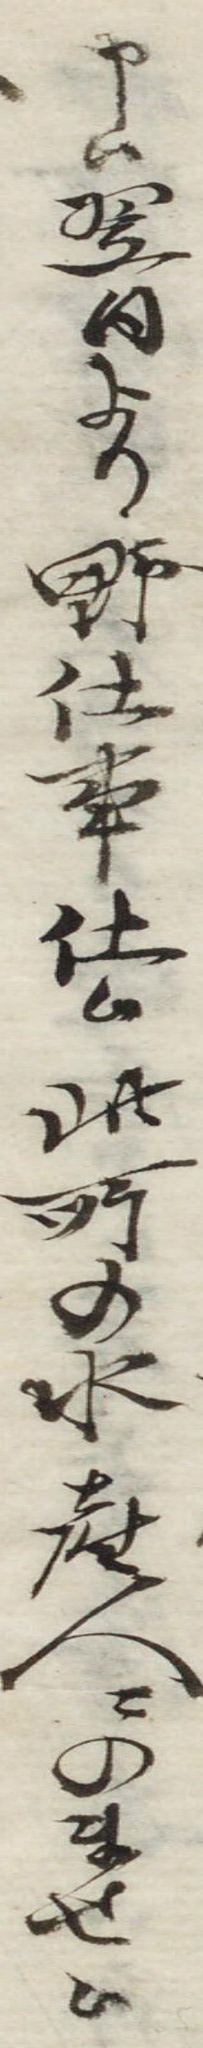申候翌日より野仕事仕候此所の水産人にのませ候
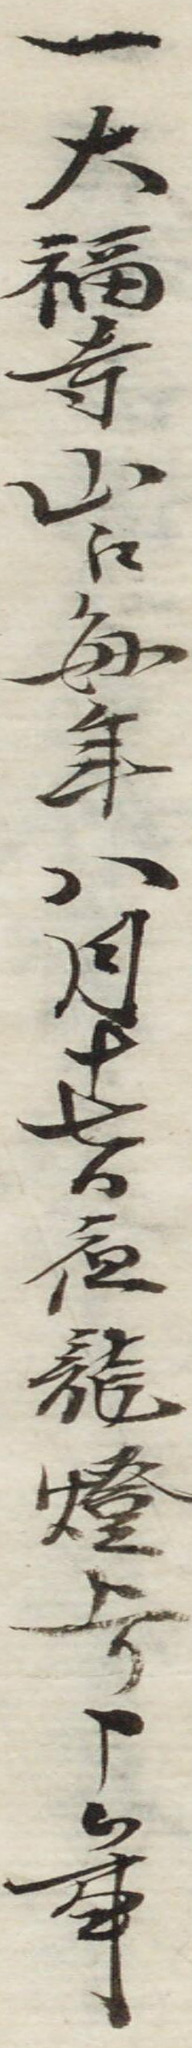一大福寺山え毎年八月十七日夜龍灯上り申候事
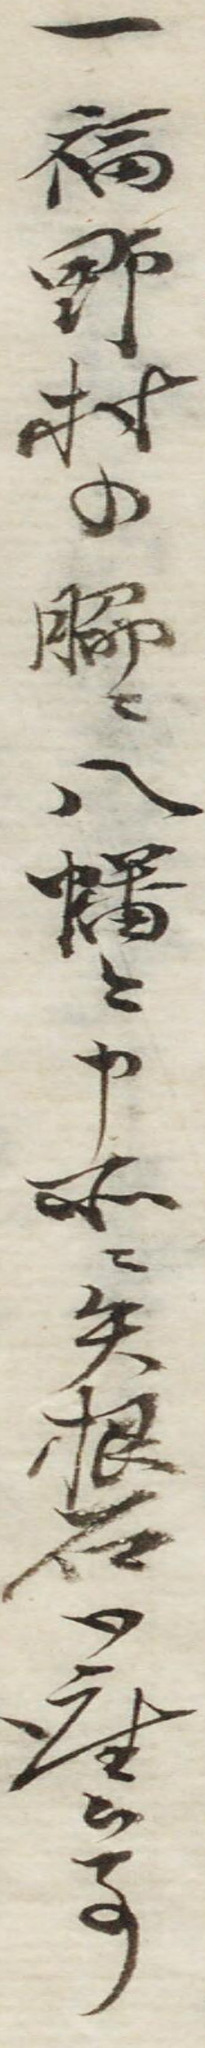一福神村の脇に八幡と申所に矢根石御座候事
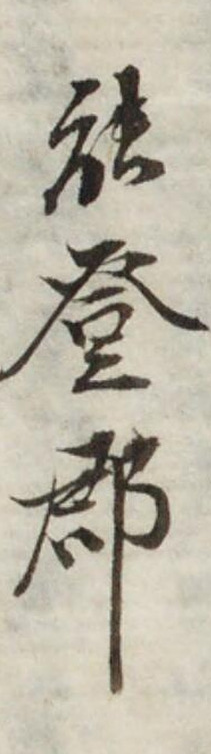能登郡
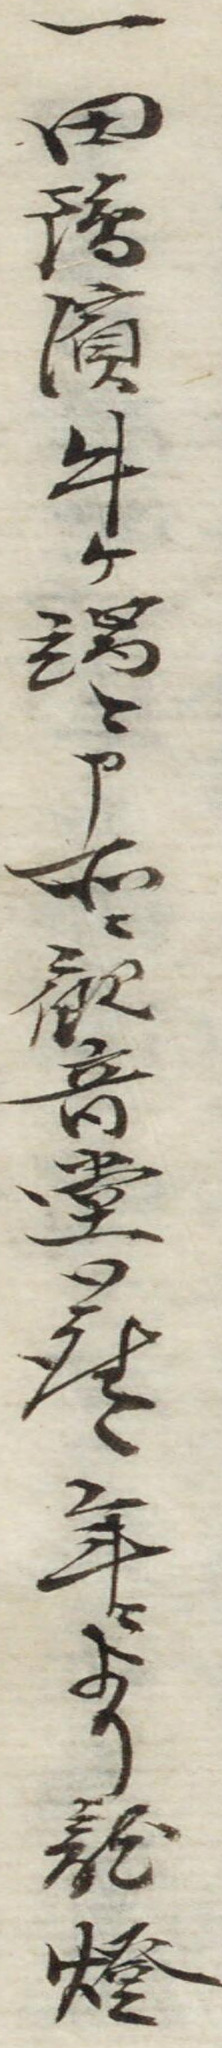一田鶴浜牛ヶ端と申所に観音堂御座候年により龍灯
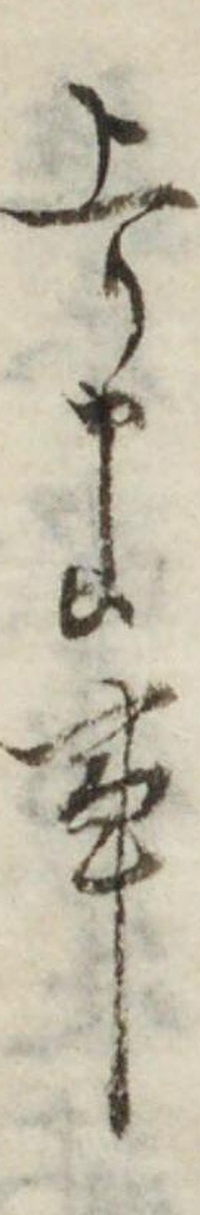上り申候事

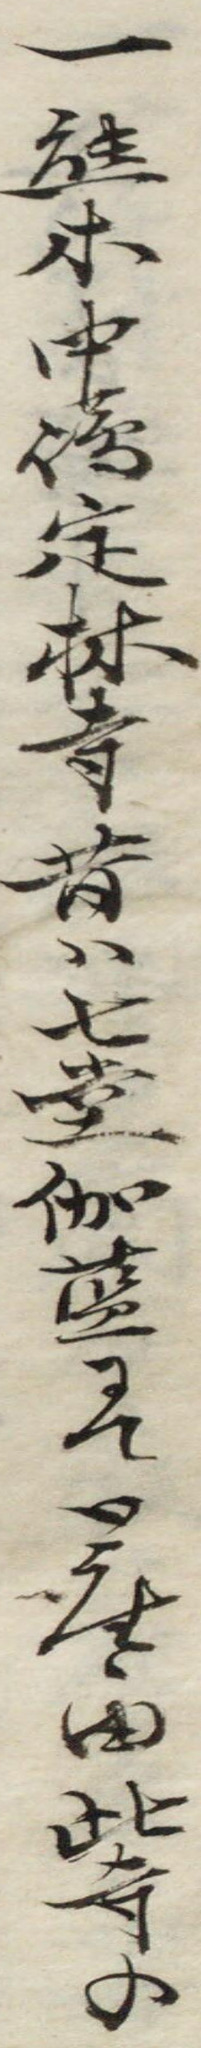一熊木中嶋定林寺昔は七堂伽藍にて御座候由此寺の
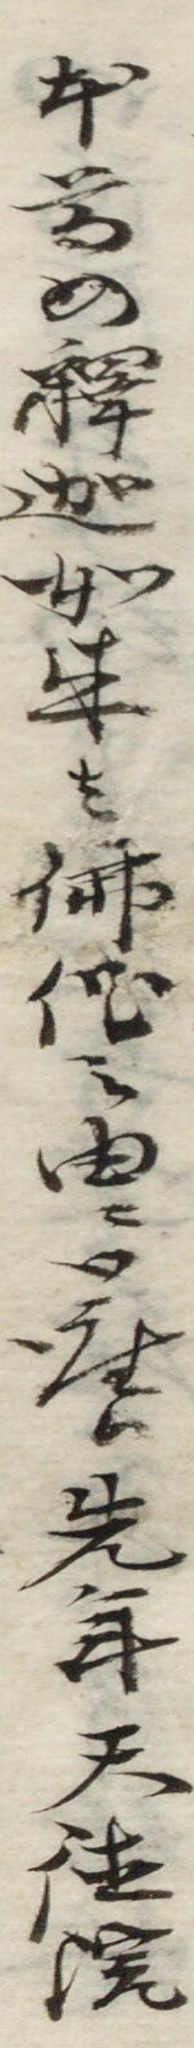本尊の釈迦如来は仏作之由に御座候先年天徳院
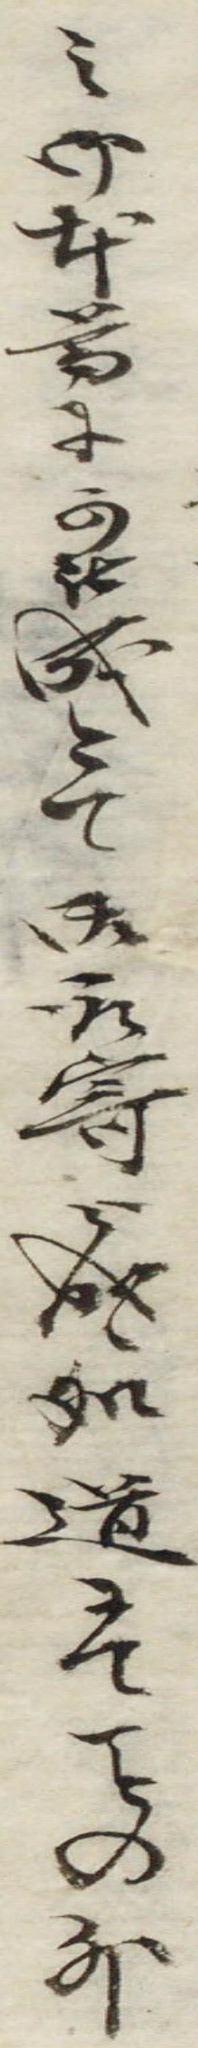之本尊に可被成とて御取寄被成候処道にてことの外
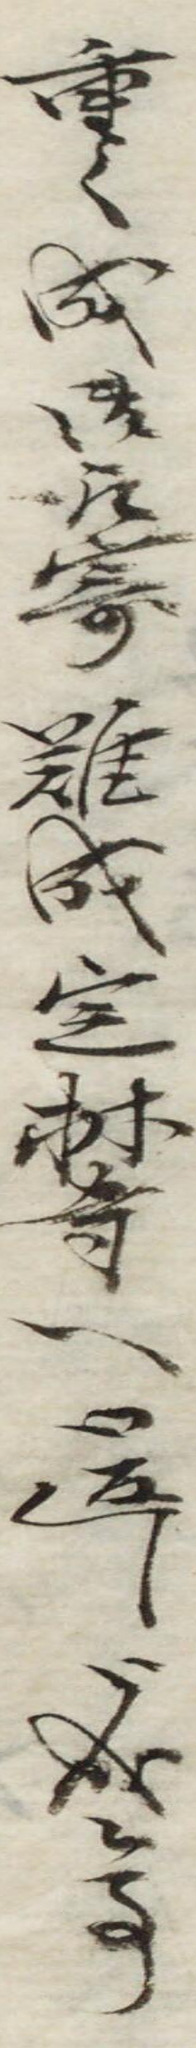重く成御取寄難成定林寺へ御返し被成候事
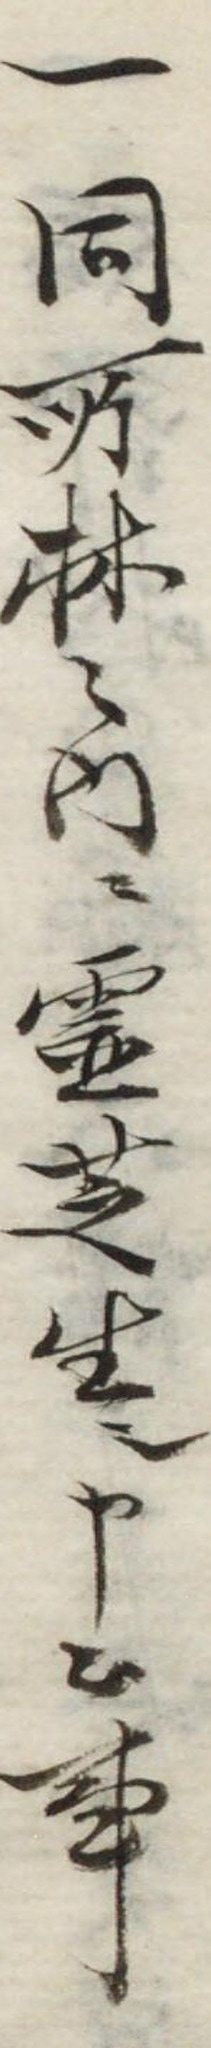一同所林之内に霊芝生し申候事
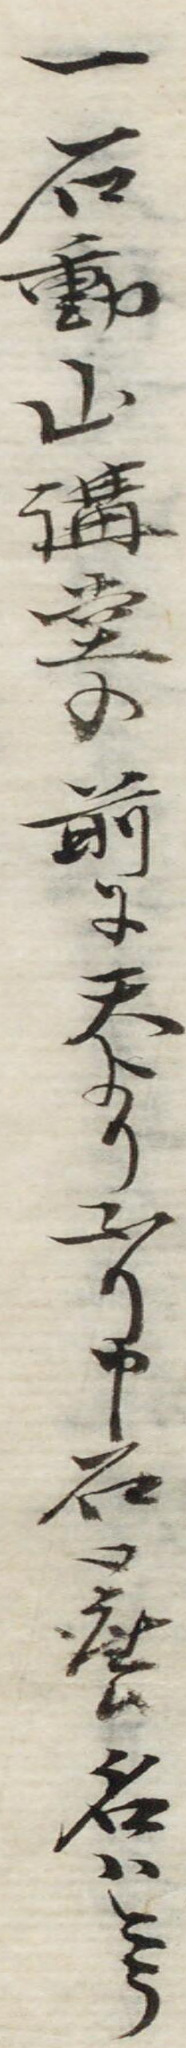一石動山講堂の前に天よりふり申石御座候名はどう
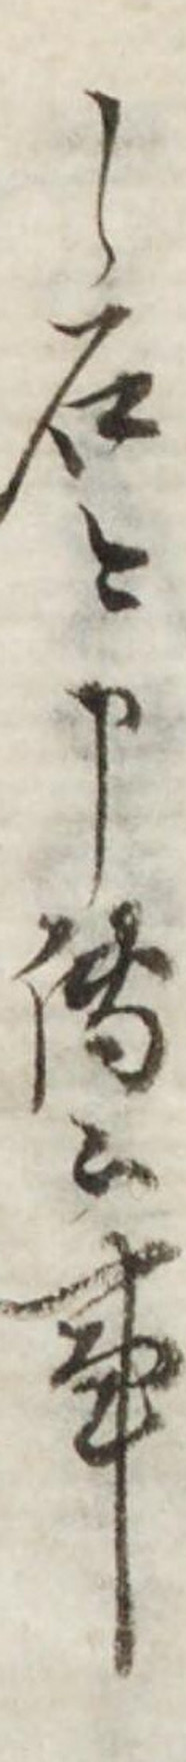し石と申伝候事
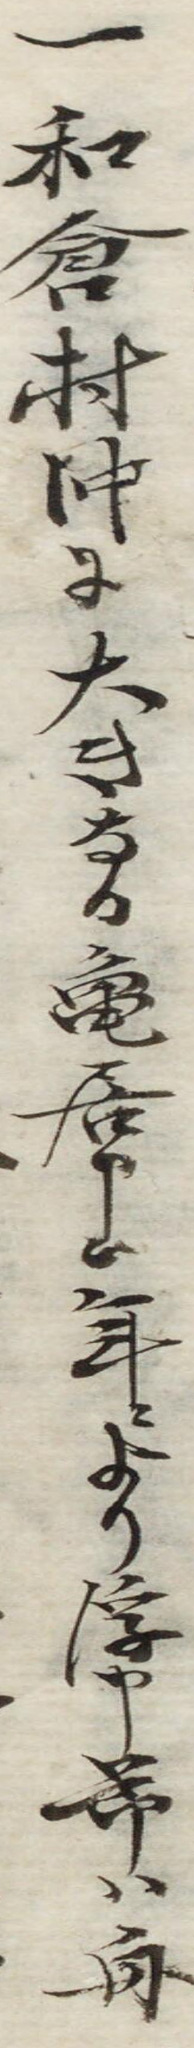一和倉村沖に大きなる亀居申候年により浮申節は舟
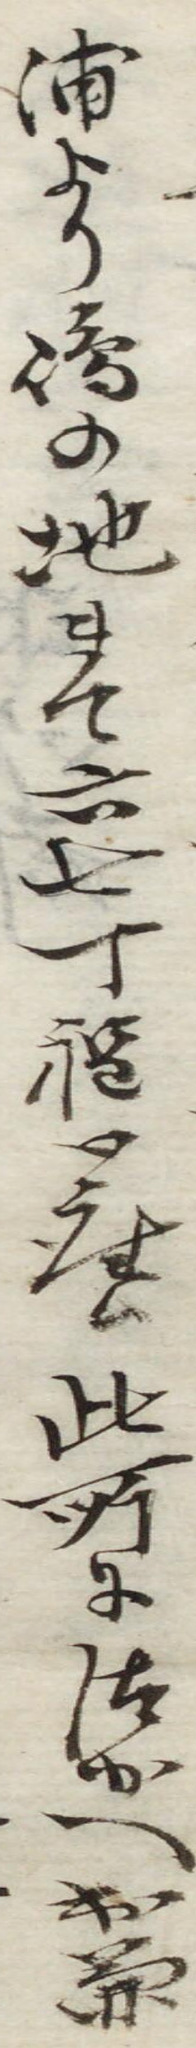浦より嶋の地まて六七丁程御座候此所につかへ出兼
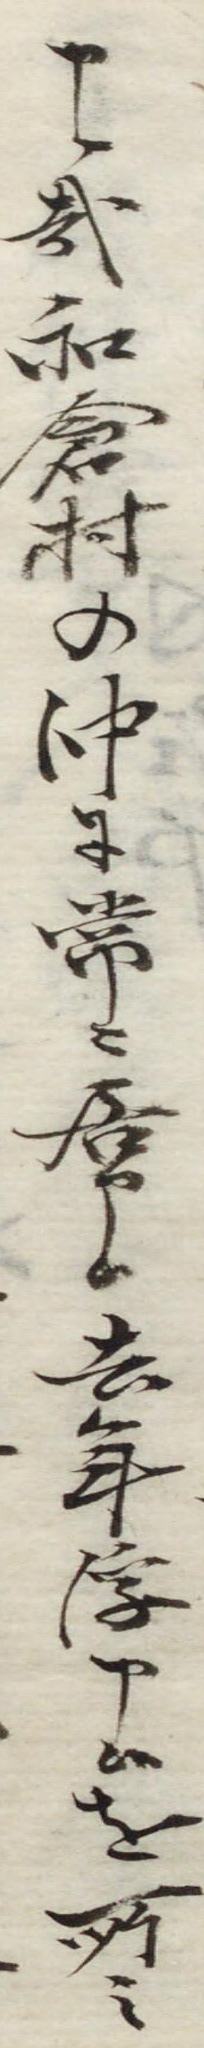申候哉和倉村の沖に常に折申候去年浮申候を所之
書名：古老旧聞紀略
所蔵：Ishikawa Prefectural Library
